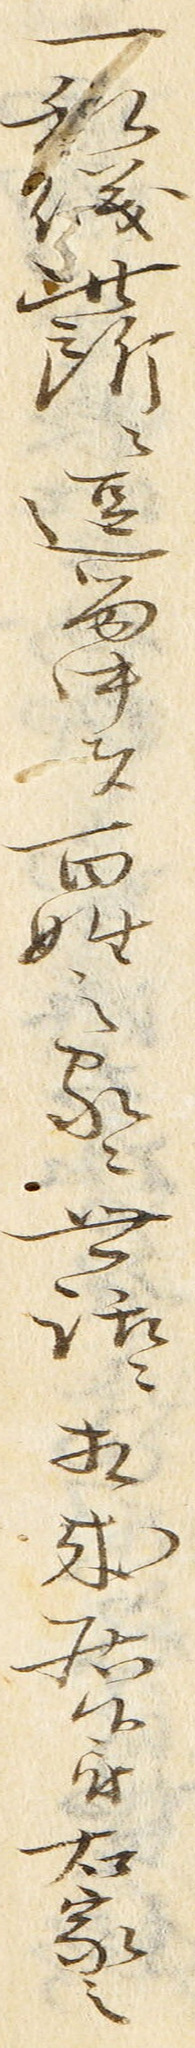一私儀此所に逗留中は百姓之家に世話に相成居候に付右家之
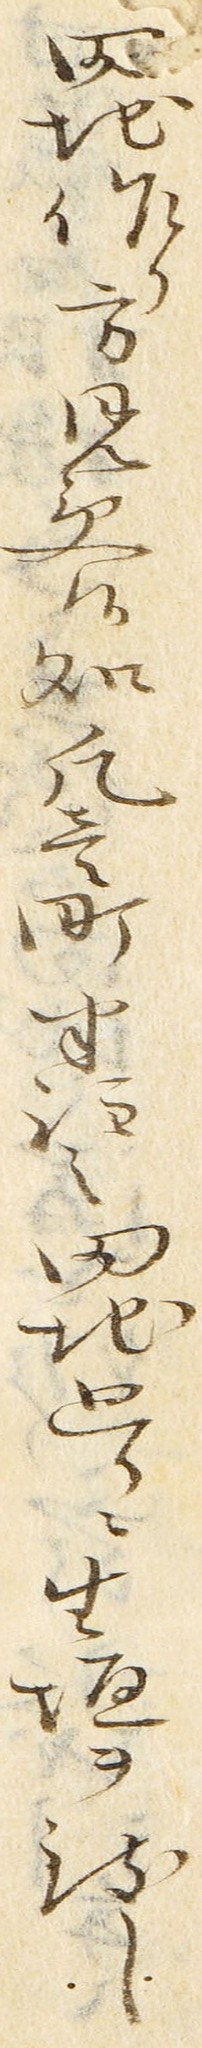田地作り方見受候処凡壱町半程之田地廻りに生垣ヲ致し
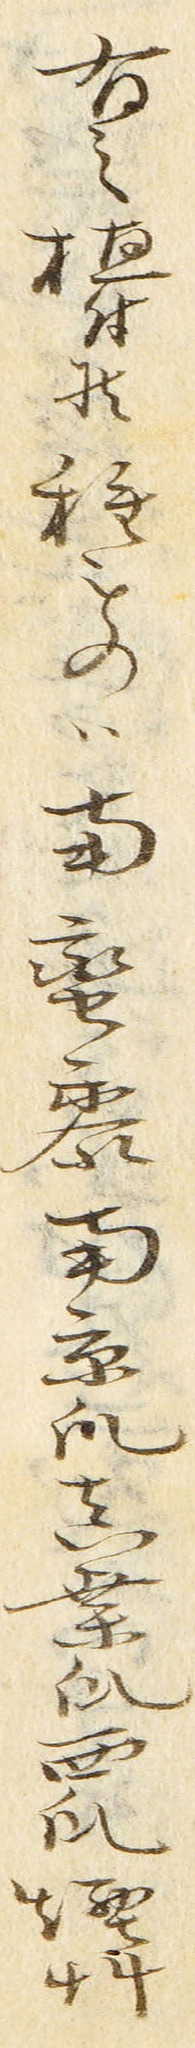有之植付候種ものは南蛮黍南京瓜真西瓜煙草
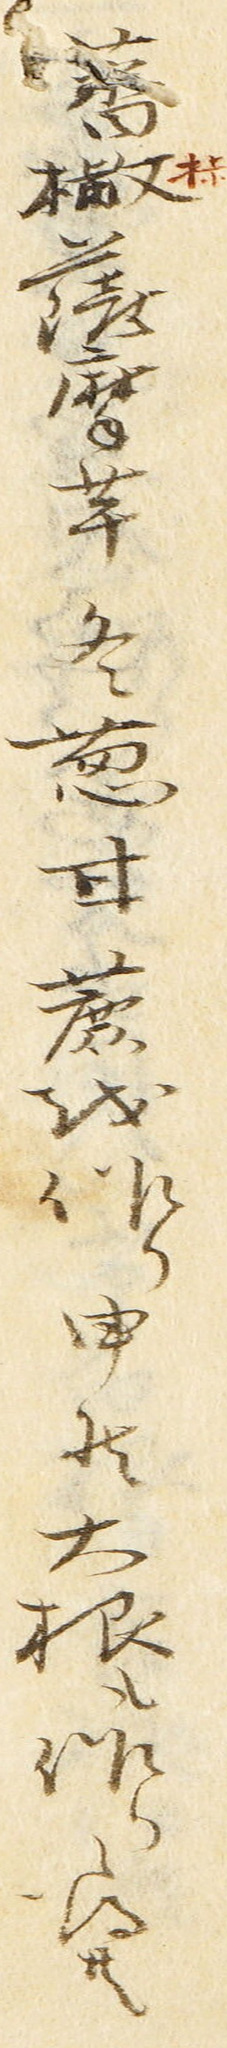蕃椒薩摩芋冬葱甘蔗を作り申候大根も作り候得共
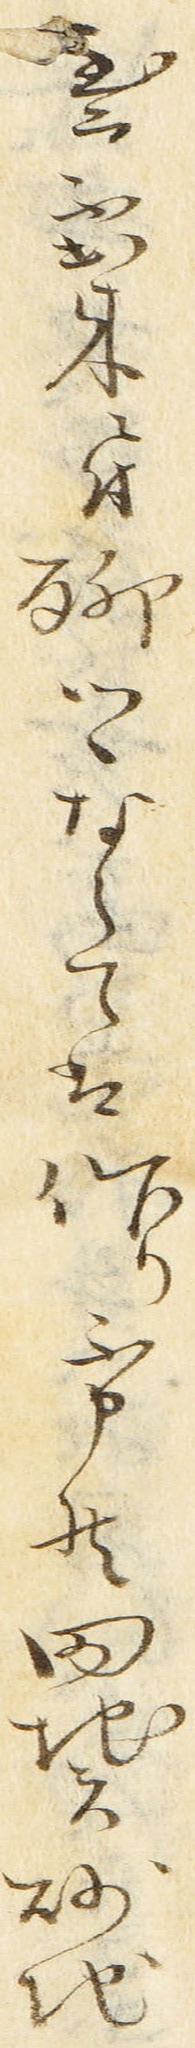至而不出来に付殆つつなしては作り不申候田地は砂地
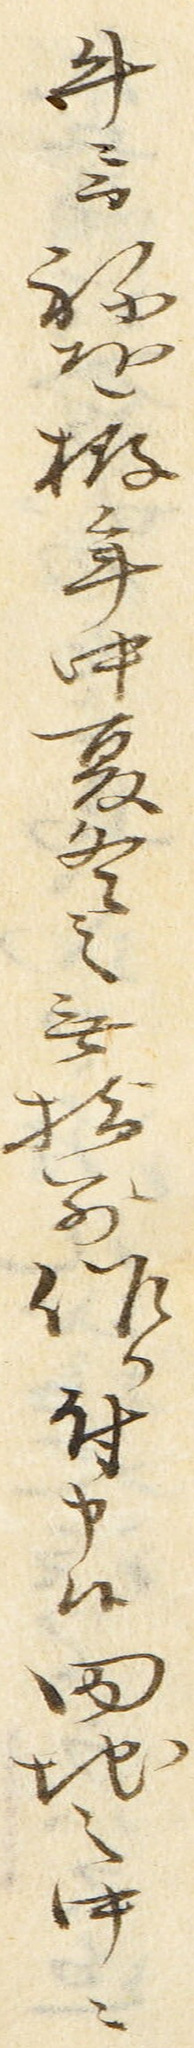牛に而祢を栫年中夏冬之無指別作り付申候田地之中に
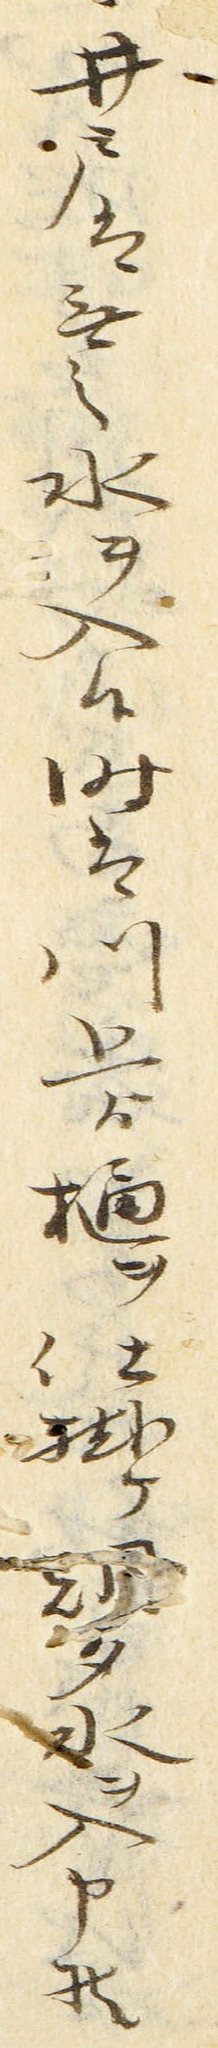井戸は無之水ヲ入候時は川上ゟ樋を仕掛け朝夕水ヲ入申候

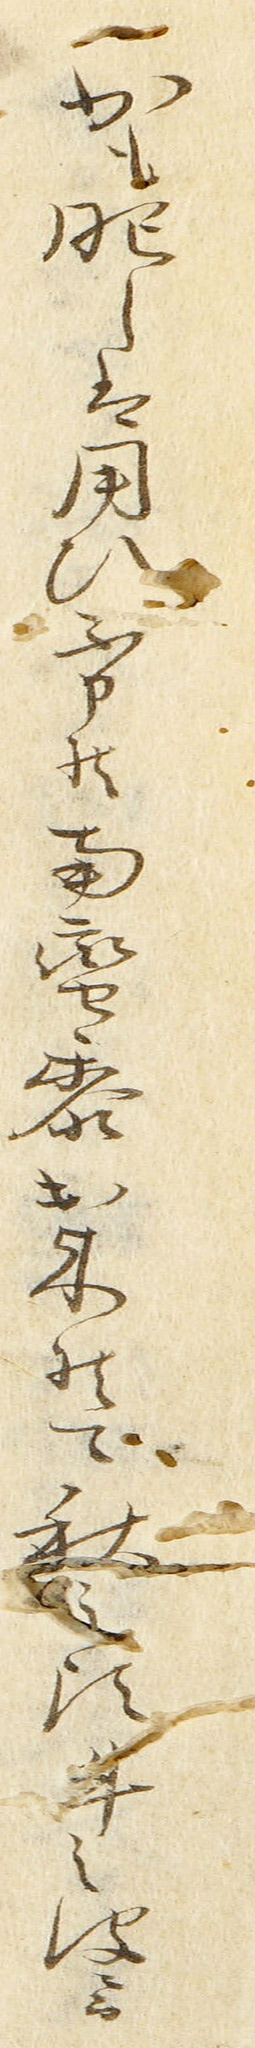少も肥しは用ひ不申候南蛮黍出来候て秋之頃牛之皮に而
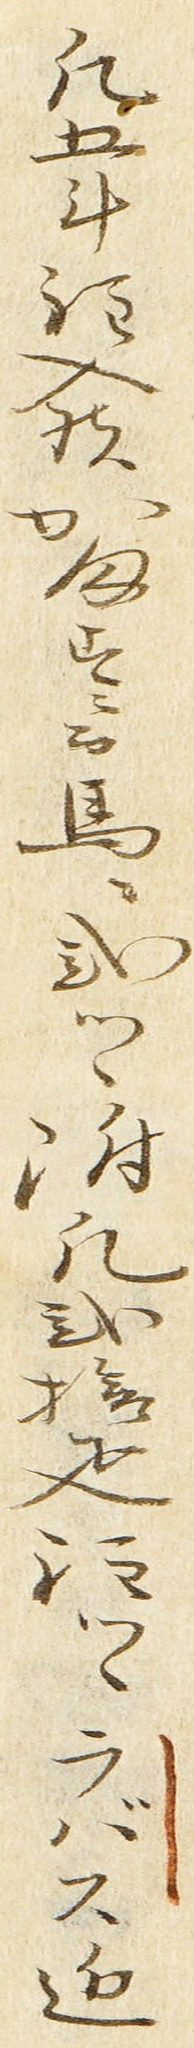凡五斗程入致かますに而馬に貳つつ附凡弐拾疋程つつラバス辺
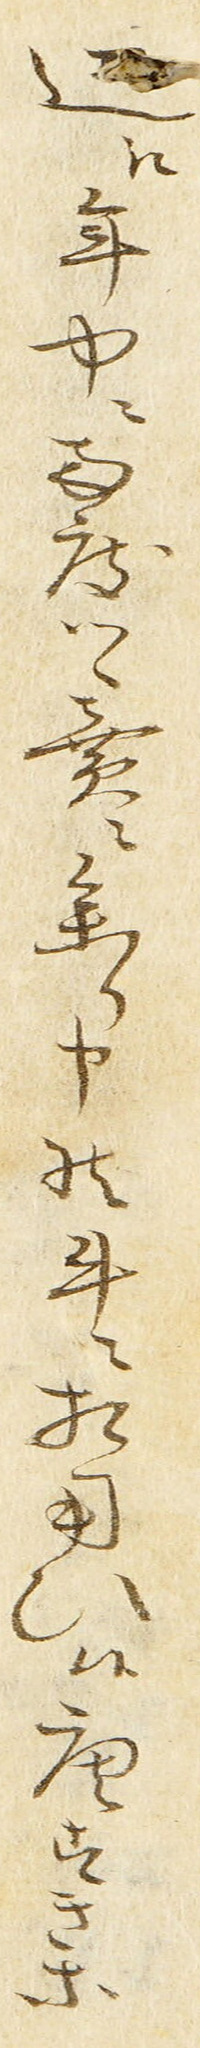迠江年中に両度つつ売に参り申候牛に相用ひ候唐すき等
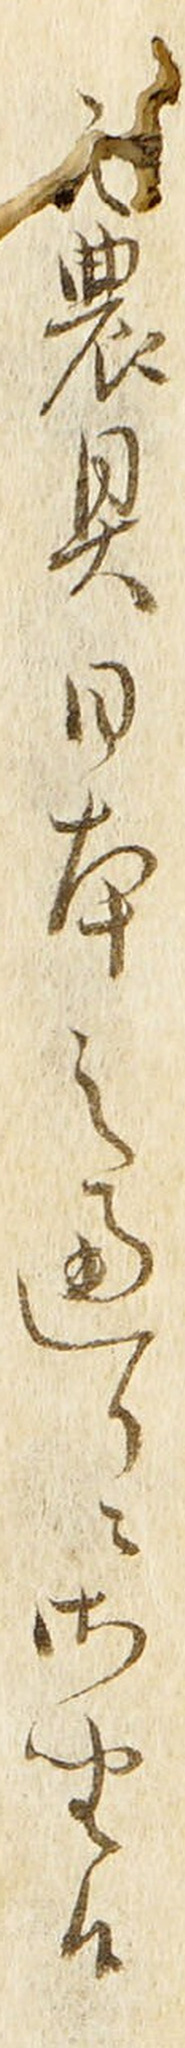之農具日本之通りに御座候
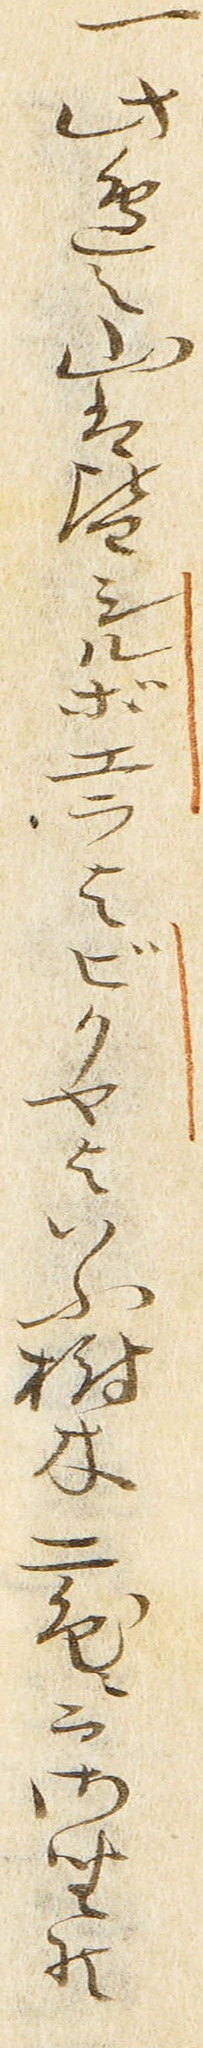一此辺之山は皆シルボエラとビクヤといふ柎木二色に而御座候
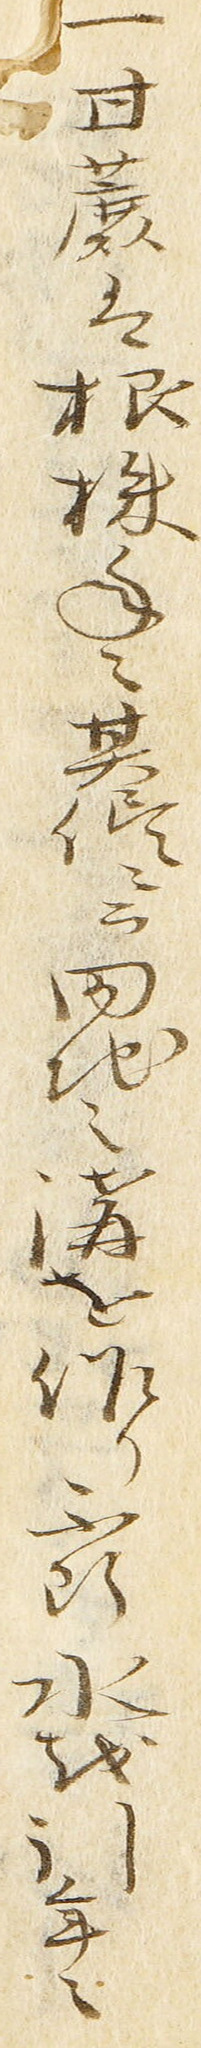一甘蔗は根株年に其侭に而田地之溝を作り不改水ヲ引年々
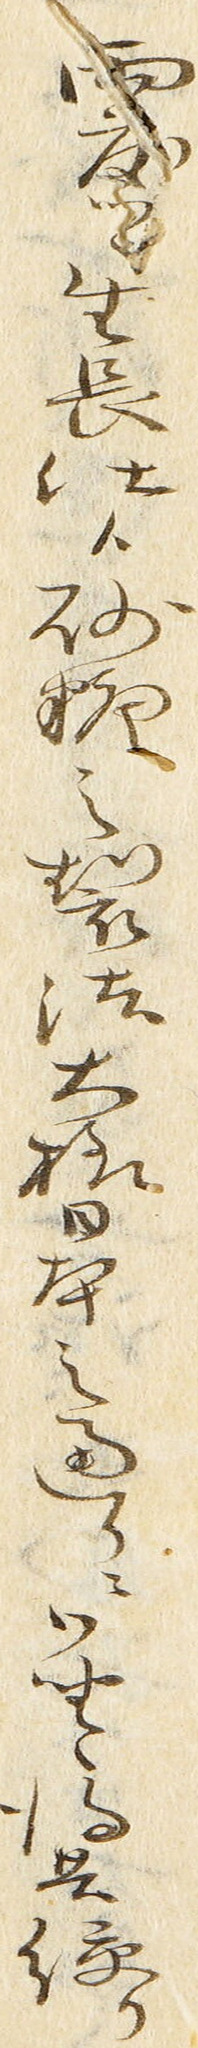両度つつ生長仕候砂糖之製法大様日本通りに御座候得共絞り
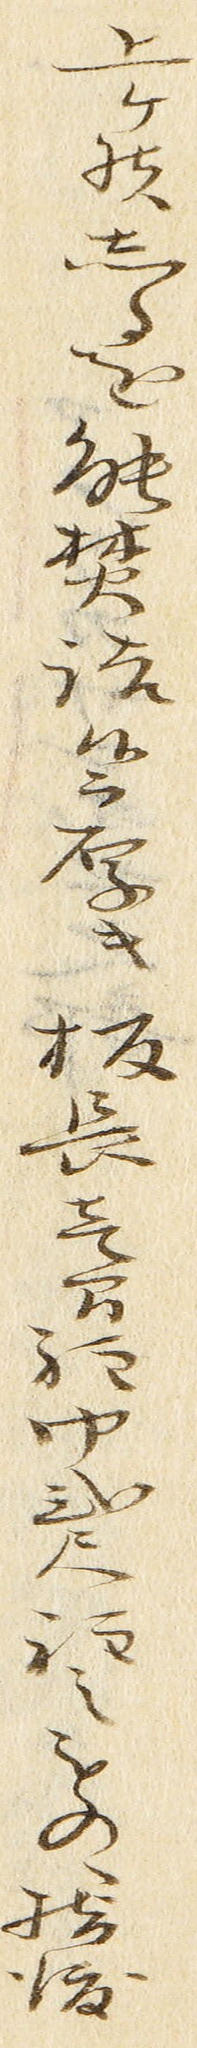上ケ致しるを能焚詰候而厚き板長壱間程巾弐尺程之ものへ指渡
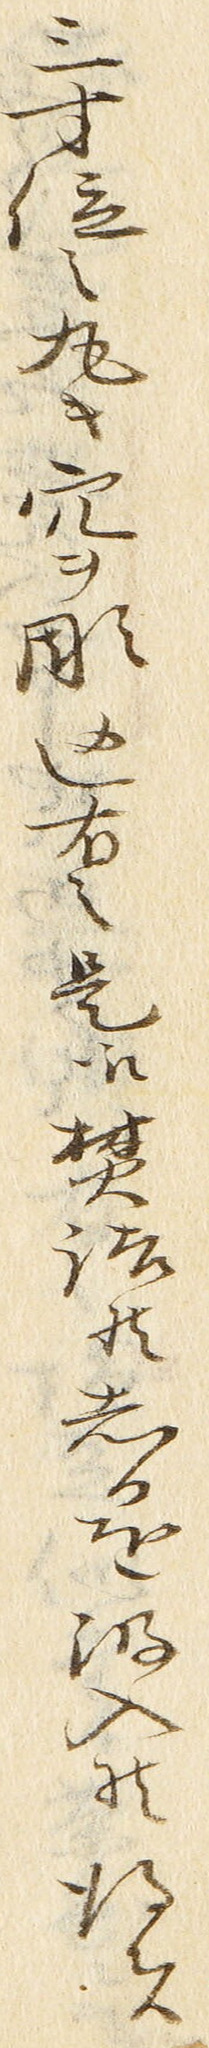三寸位之丸き穴ヲ彫込有之是取焚詰候しるを投入候得は
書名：漂流人弥市之記
